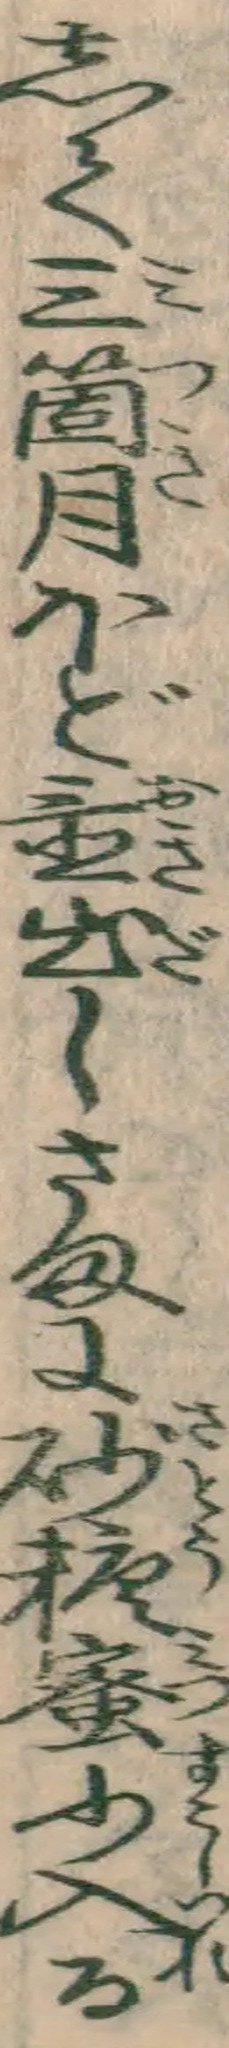して三箇月ほど置出しさまに砂糖蜜少入る
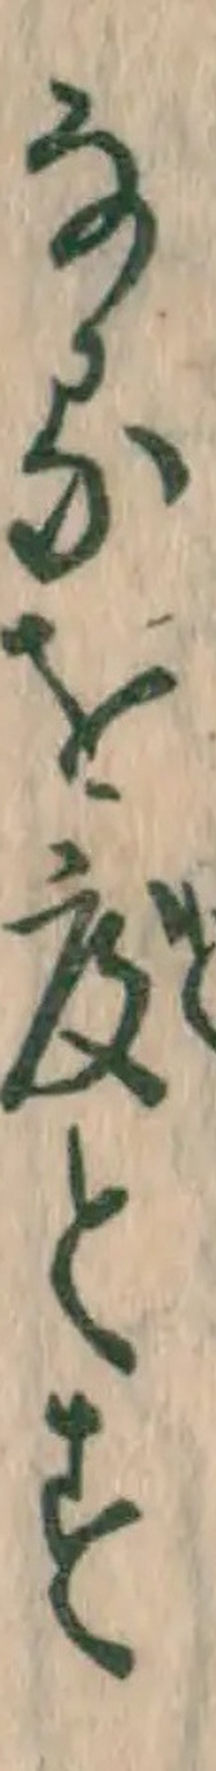なるを度とす

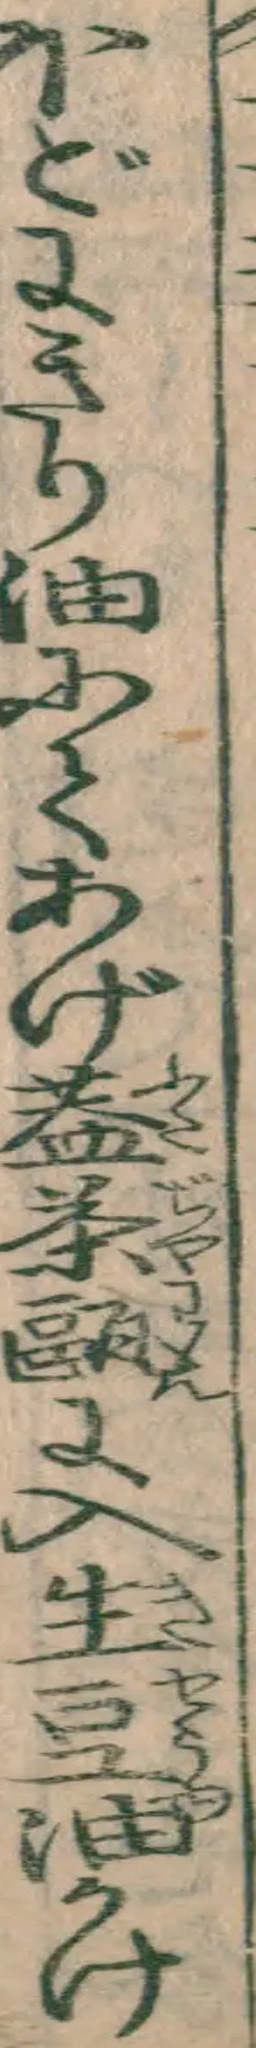ほどにきり油にてあげ蓋茶甌に入生豆油かけ
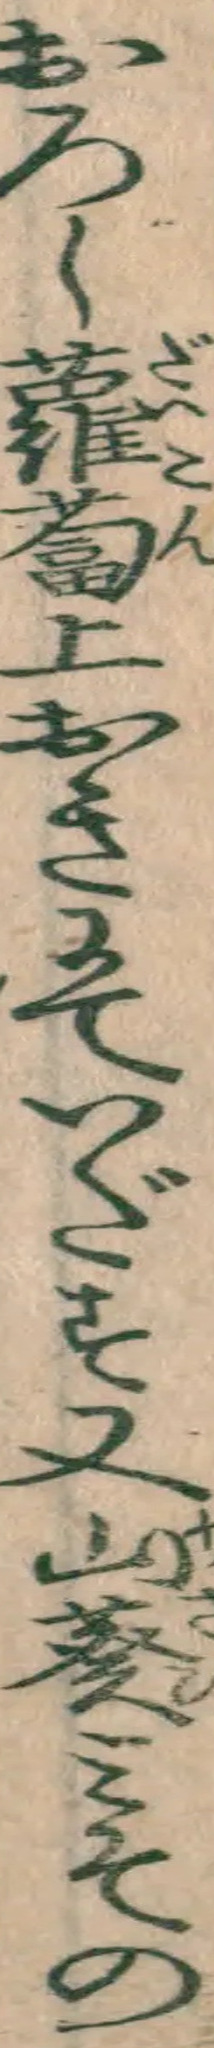おろし蘿蔔上おきにていだす又山葵みその
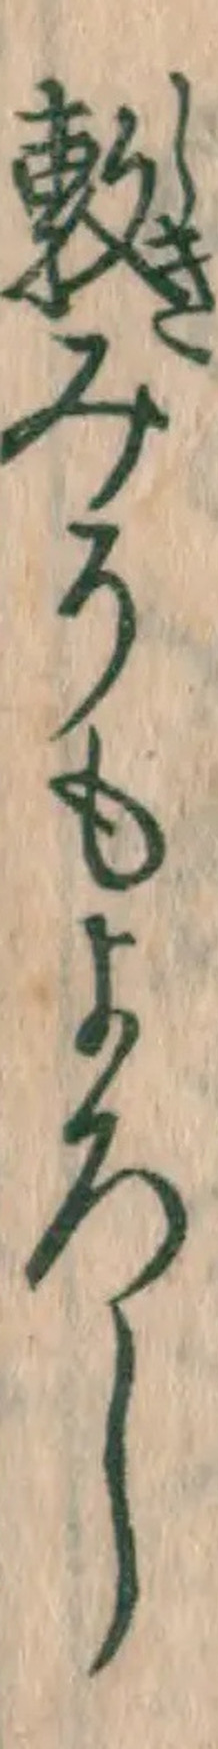敷みそもよろし
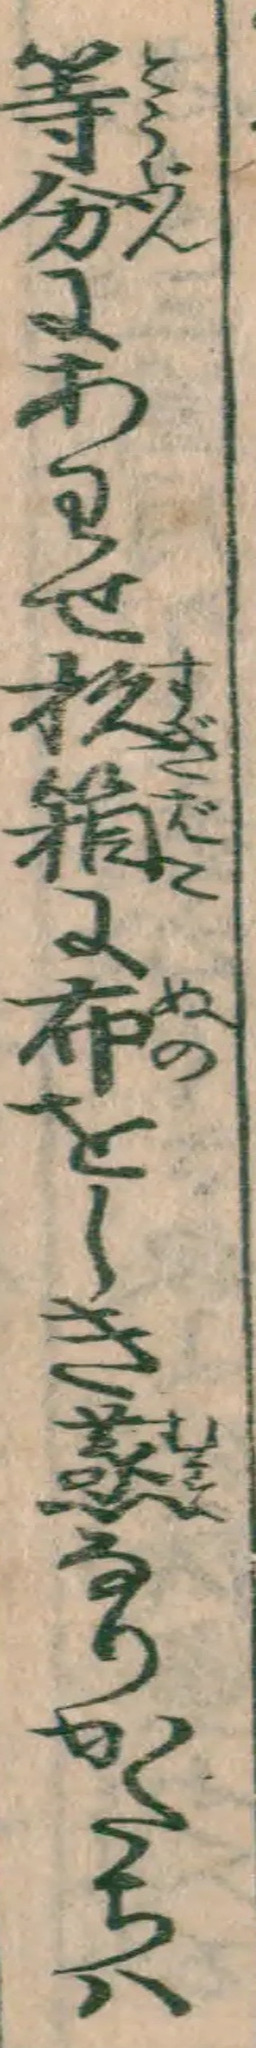等分にあわせ杉箱に布をしき蒸なりかたちは
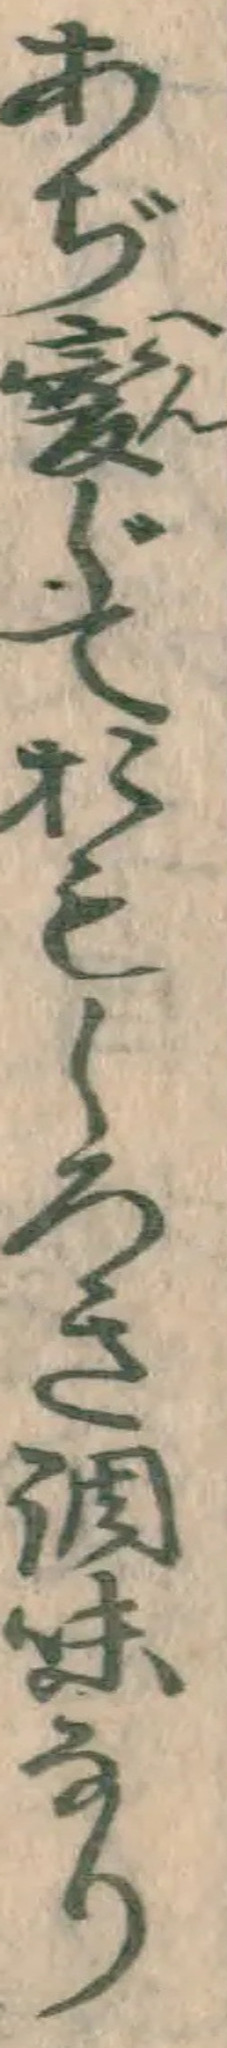あぢ変じておもしろき調味なり
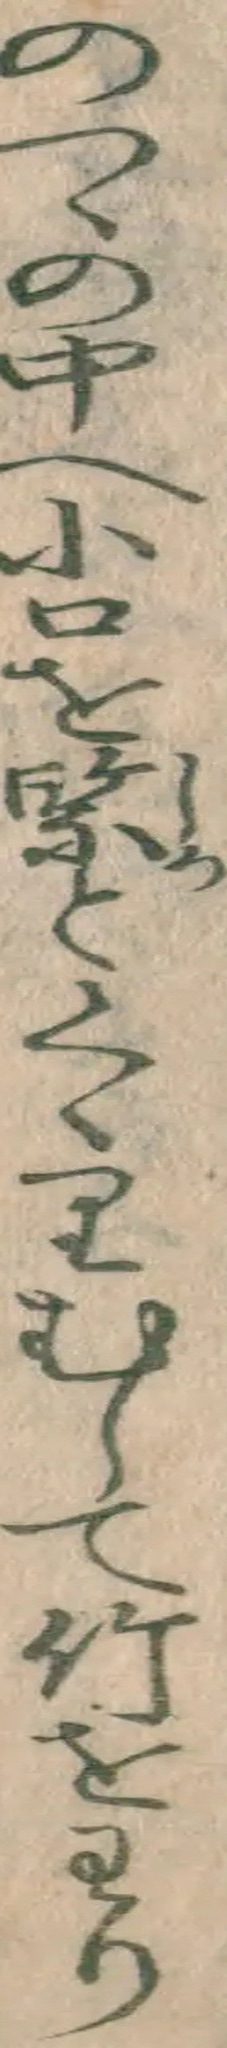のつゝの中へ小口を緊とくゝりむして竹をわり
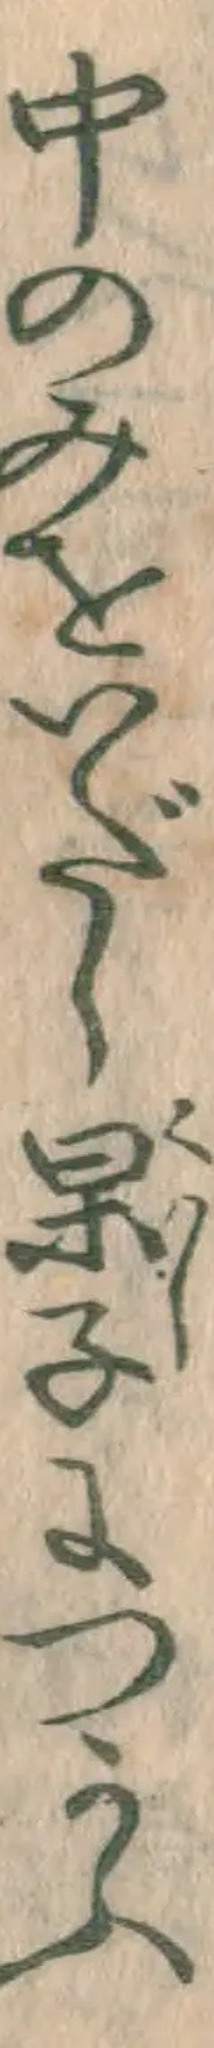中のみをいだし果子につかふ
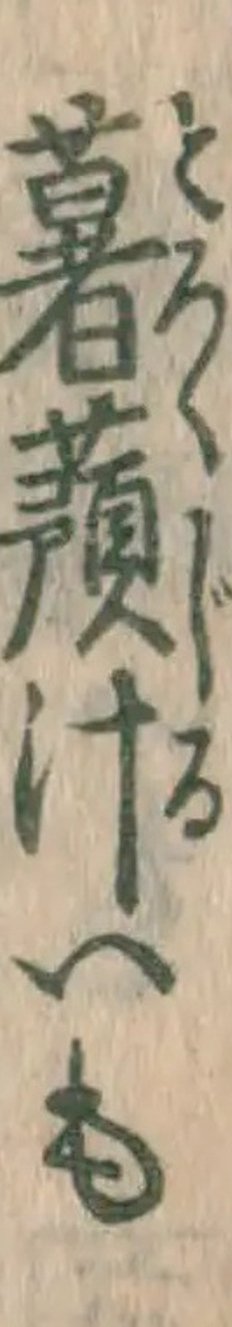薯蕷汁いも
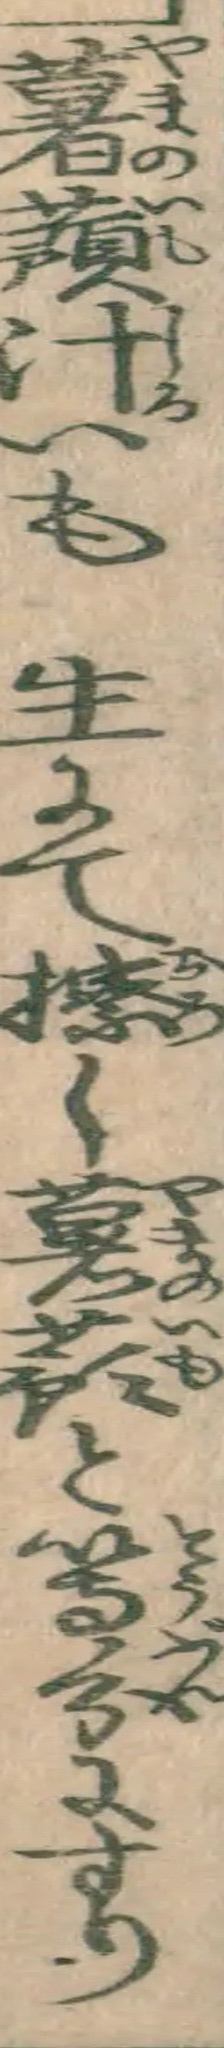[百]薯蕷汁いも生にて擦し薯蕷と等分にすり
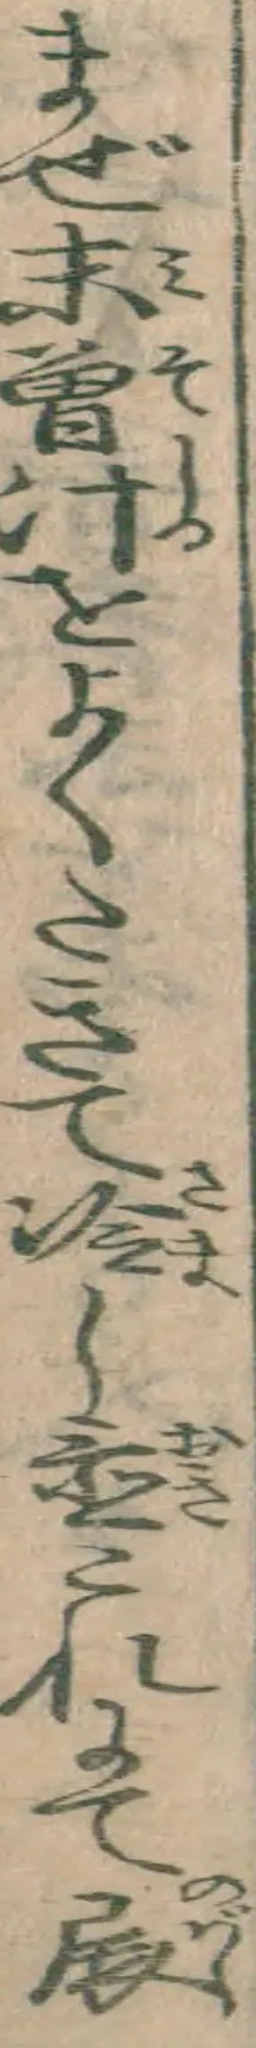まぜ未曽汁をよくたきて冷し置これにて展

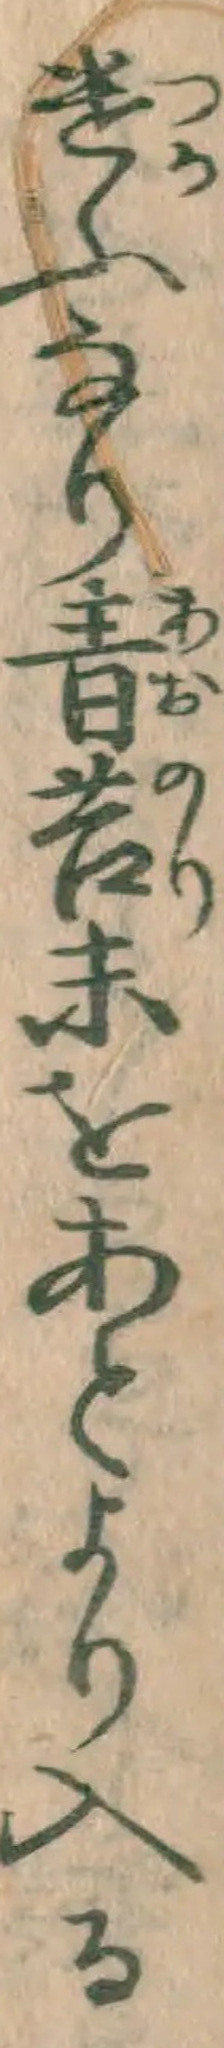遣ふなり青苔末をあとより入る
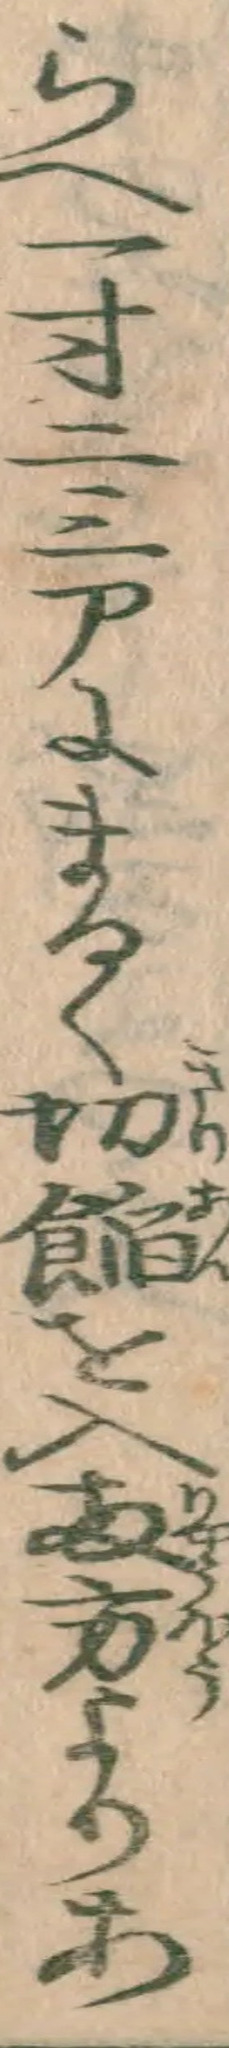らへ一寸二三部にまるく切餡を入両方よりあ
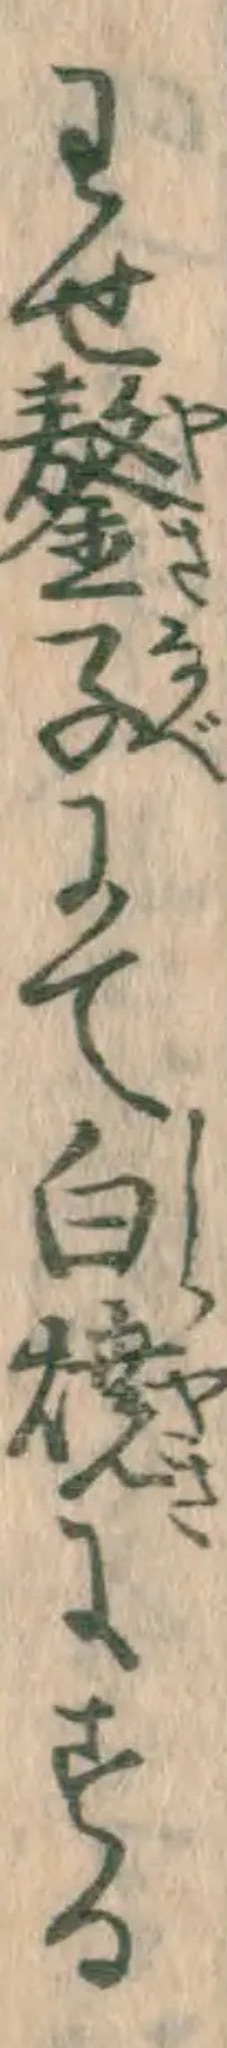わせ鏊子にて白焼にする
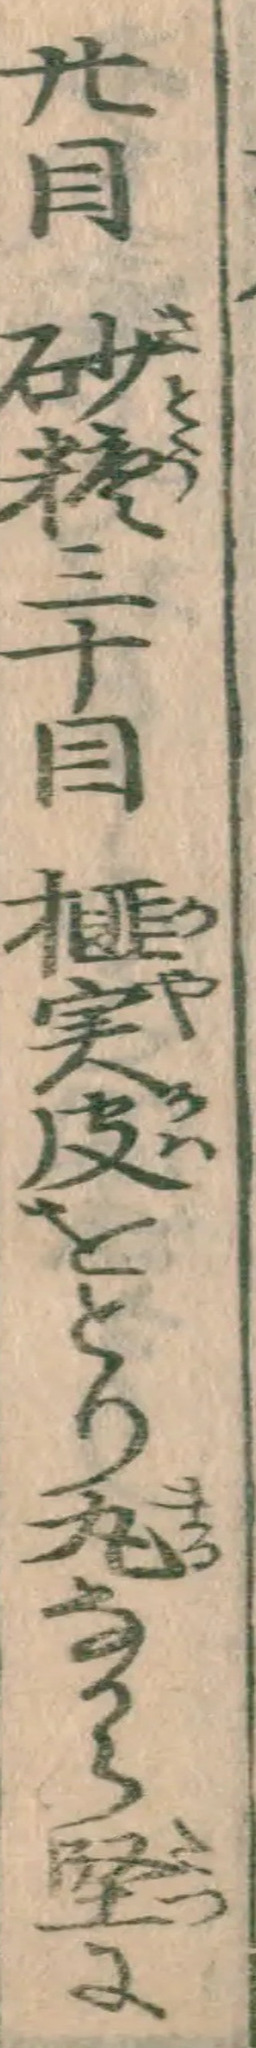廾目砂糖三十目榧実皮をとり丸なから堅に
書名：甘藷百珍
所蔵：国立国会図書館 National Diet Library, JAPAN
